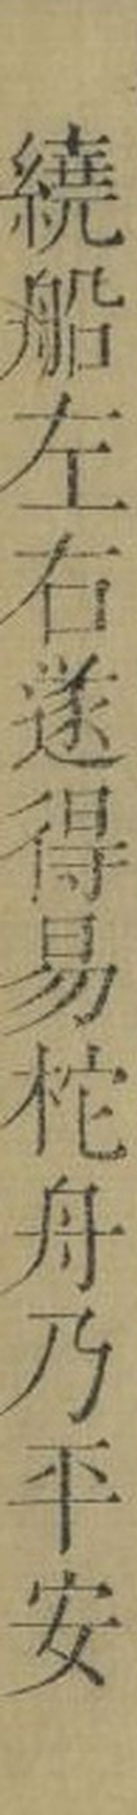繞船左右遂得易柁舟乃平安

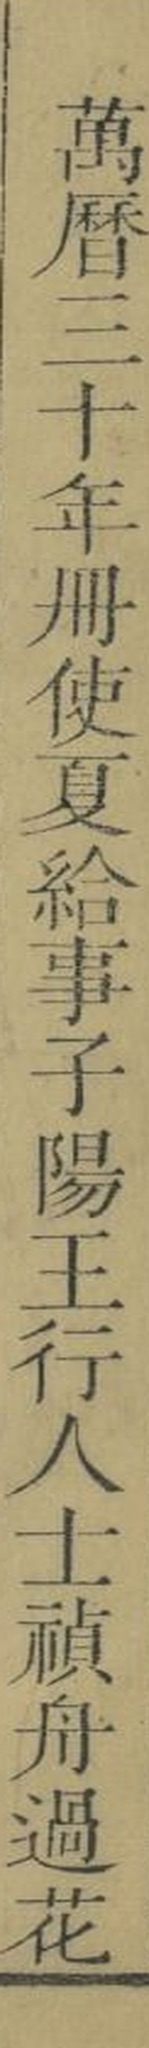萬曆三十年冊使夏給事子陽王行人士禎舟過花
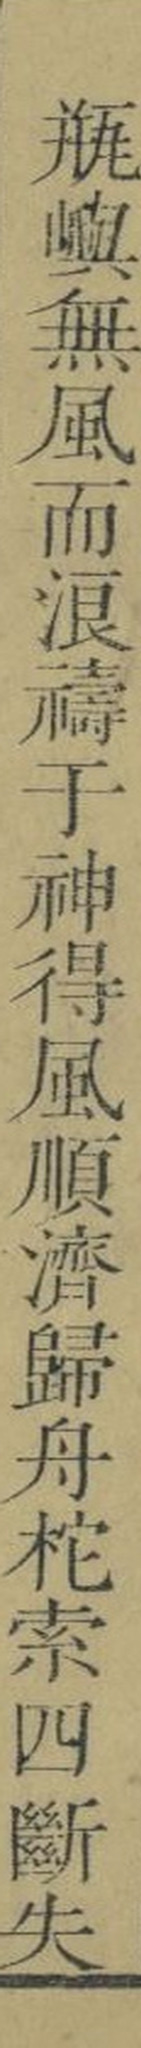瓶嶼無風而浪禱于神得風順濟歸舟柁索四斷失
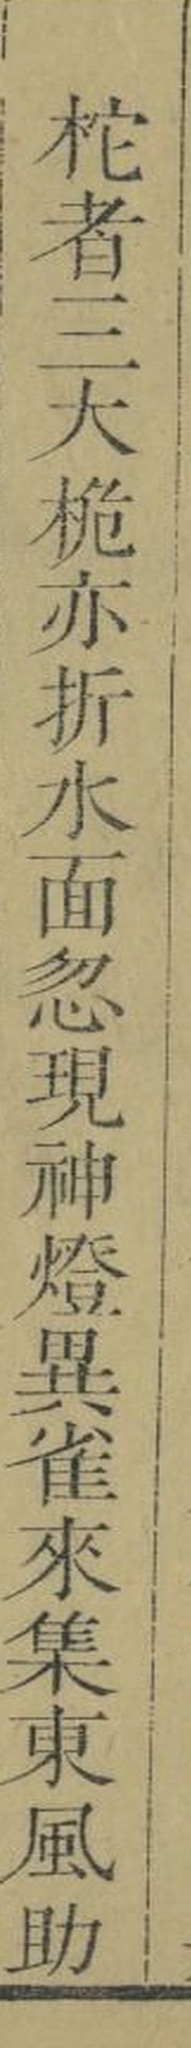柁者三大桅亦折水面忽現神燈異雀來集東風助
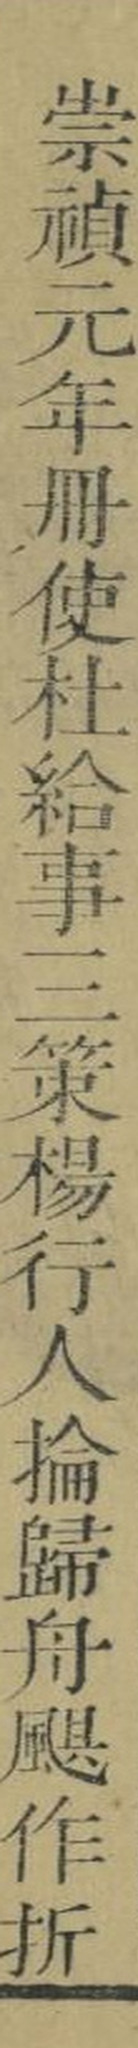崇禎元年冊使杜給事三策楊行人掄歸舟颶作折
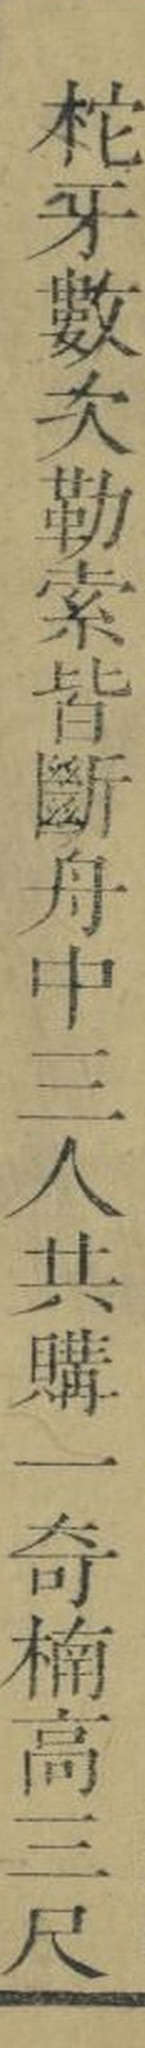柁牙數次勒索皆斷舟中三人共購一奇楠高三尺
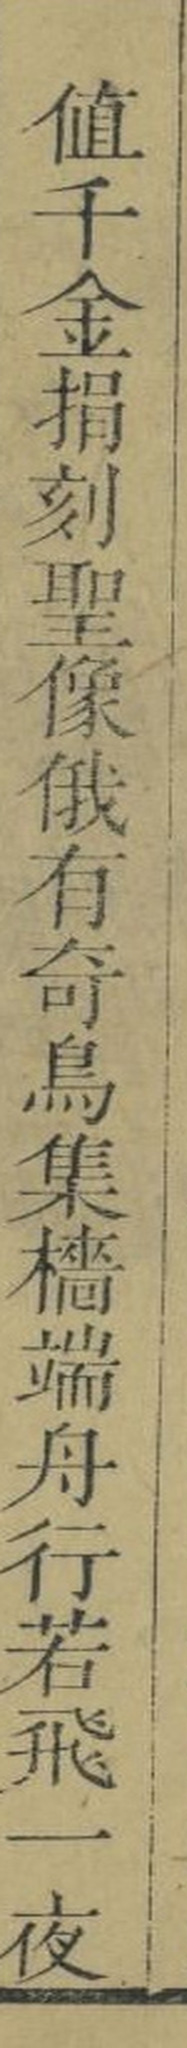値千金捐刻聖像俄有奇鳥集檣端舟行若飛一夜
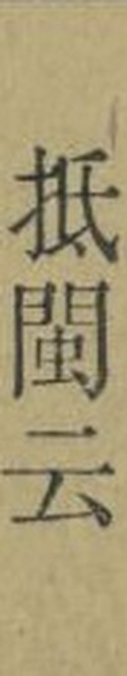抵閩云
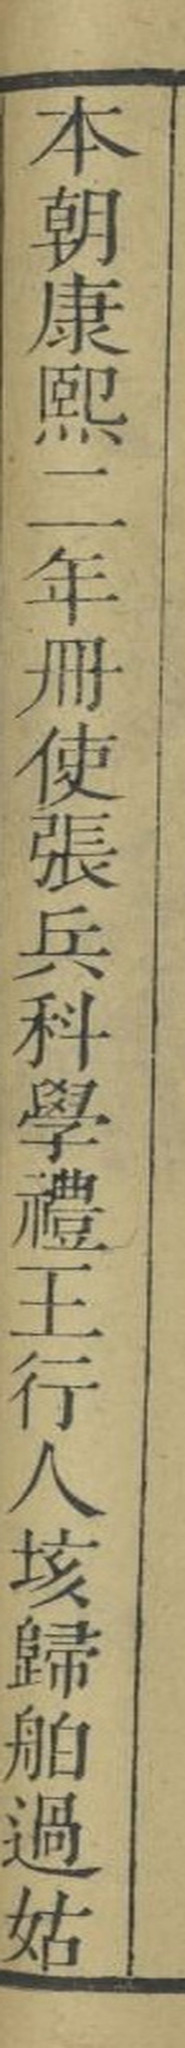本朝康熙二年冊使張兵科學禮王行人垓歸舶過姑
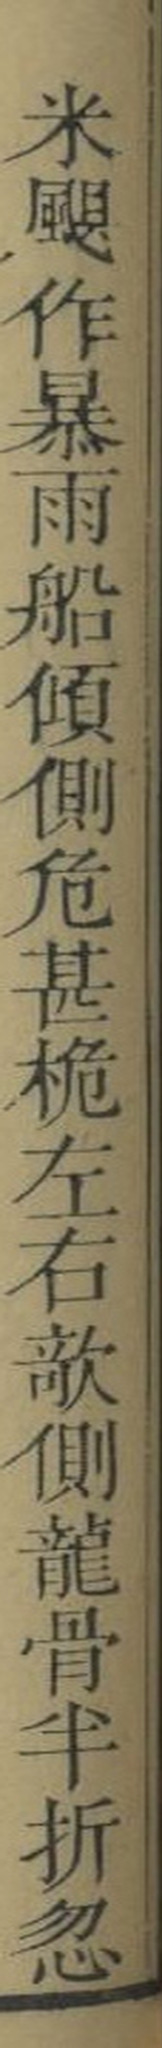米颶作暴雨船傾側危甚桅左右欹側龍骨半折忽
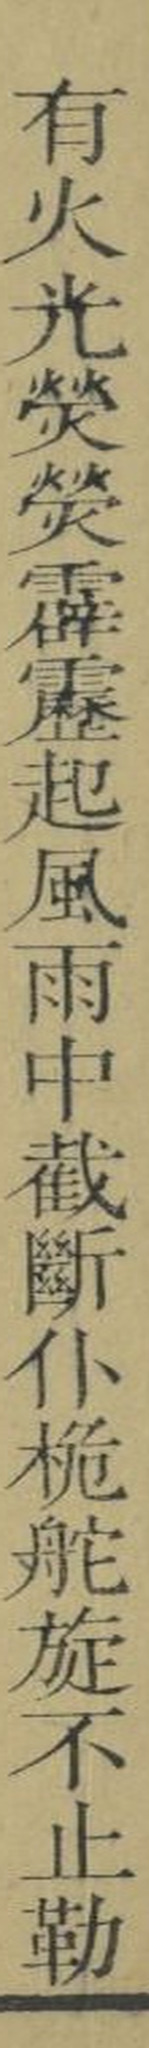有火光熒熒霹靂起風雨中截斷仆桅舵旋不止勒
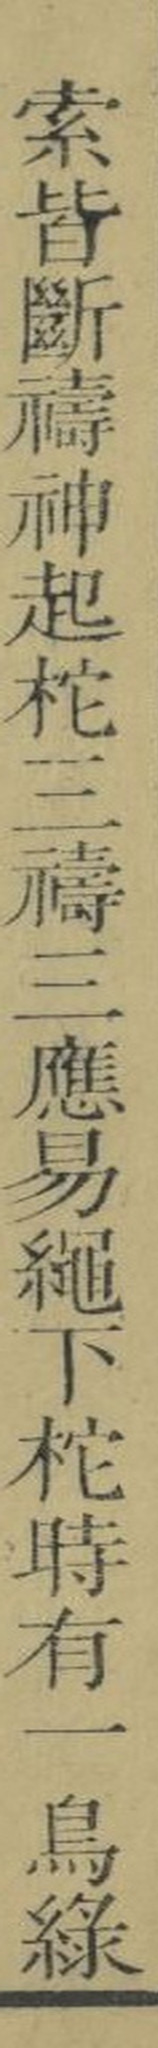索皆斷禱神起柁三禱三應易繩下柁時有一鳥綠
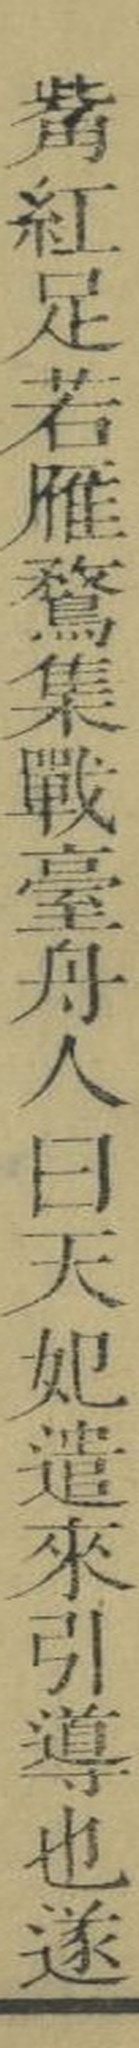觜紅足若雁鶩集戰臺舟人曰天妃遣來引導也遂
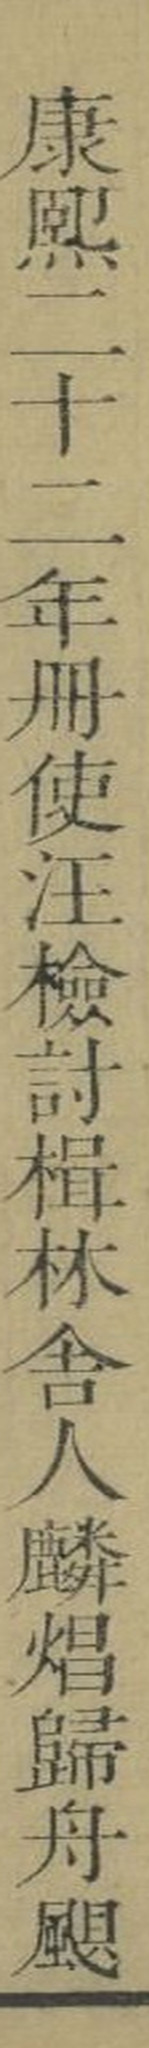康熙二十二年冊使汪檢討楫林舎人麟焻歸舟颶
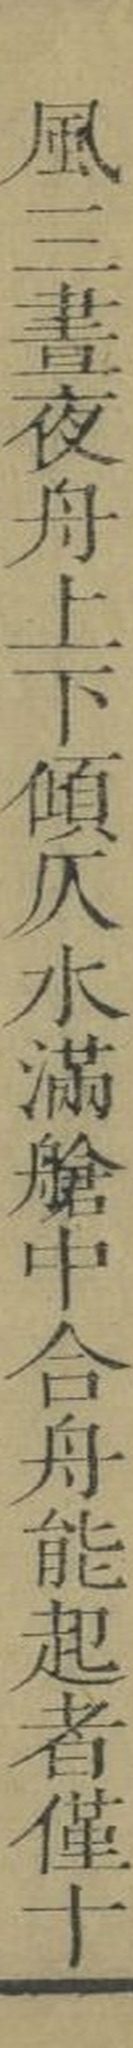風三晝夜舟上下傾仄水滿艙中合舟能起者僅十
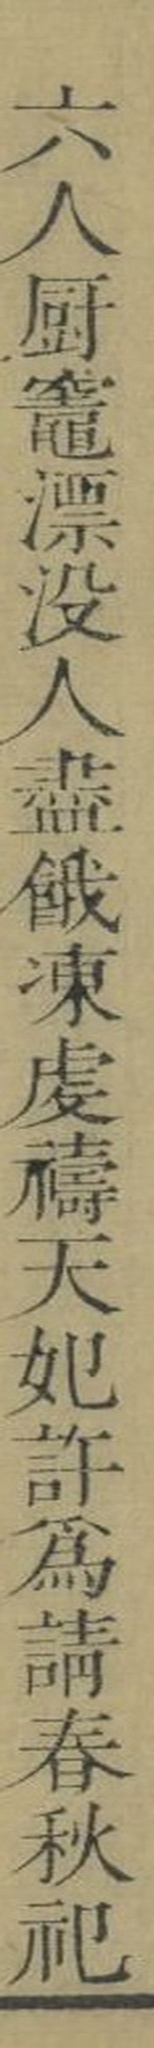六人厨竈漂没人盡餓凍䖍禱天妃許爲請春秋祀
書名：中山伝信録 巻一
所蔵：University of the Ryukyus Library
